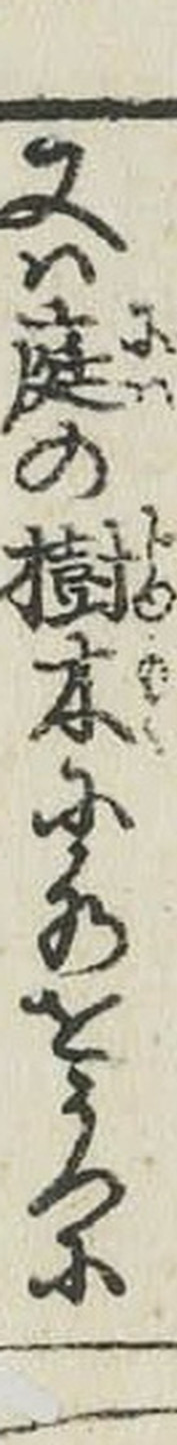又は庭の樹木に水をうつに
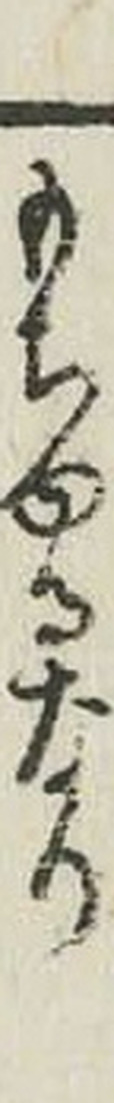もちゆるなり
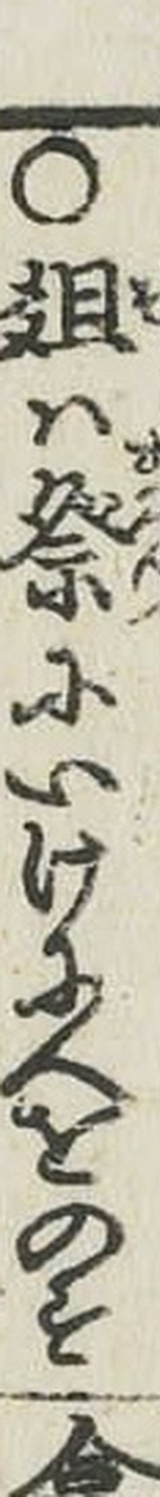○爼は祭にいけにへをのす
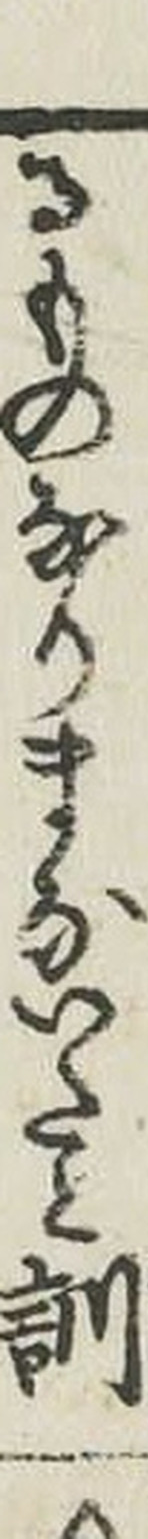るものなりまないたと訓
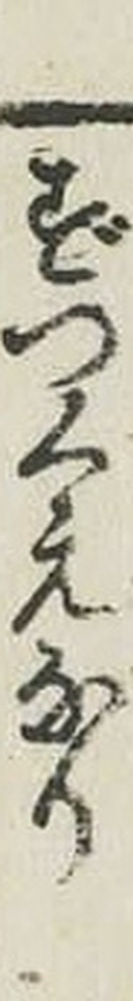ずつくえなり
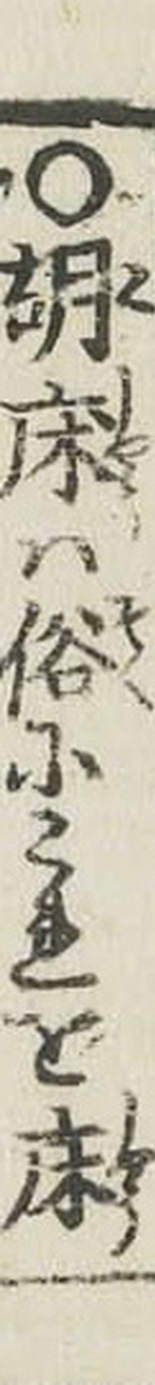○胡床は俗にこれを床
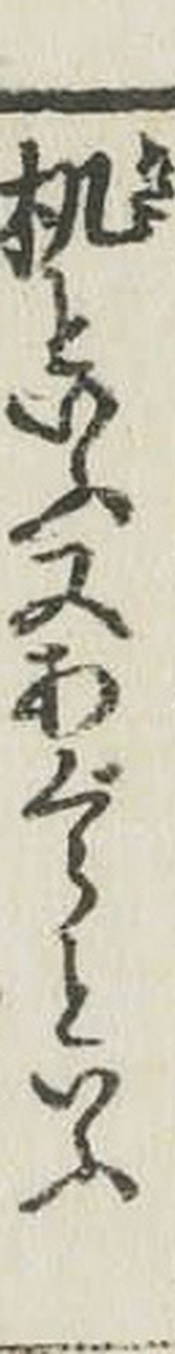机といふ又あぐらといふ
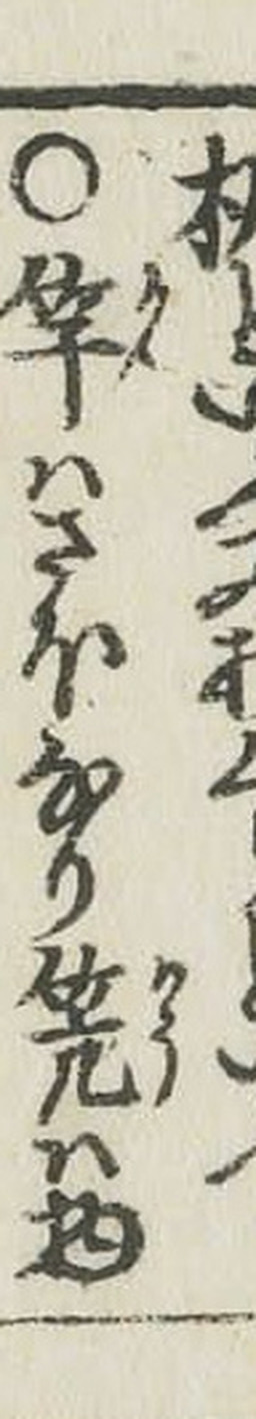○竿はさほなり笐は物
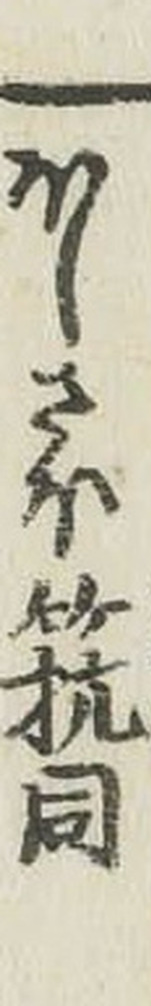ほしさほ𥮕同
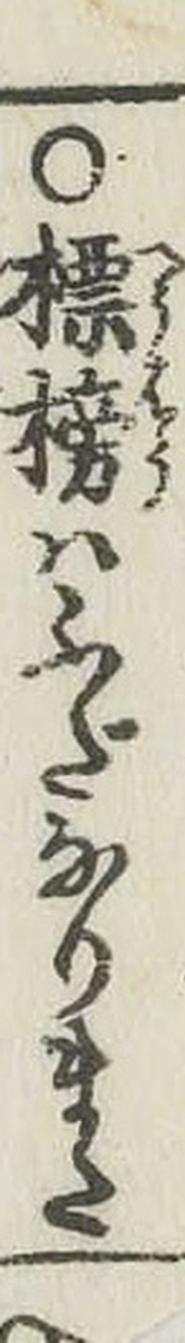○標榜はふだなりまた
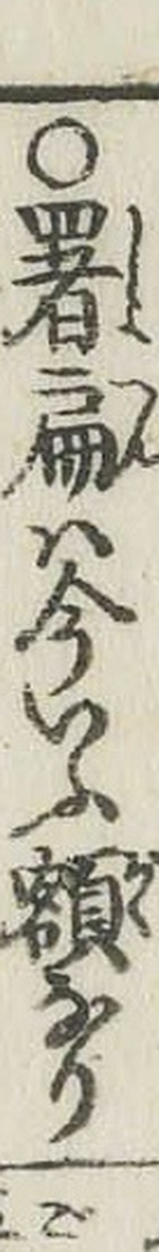○署扁は今いふ額なり
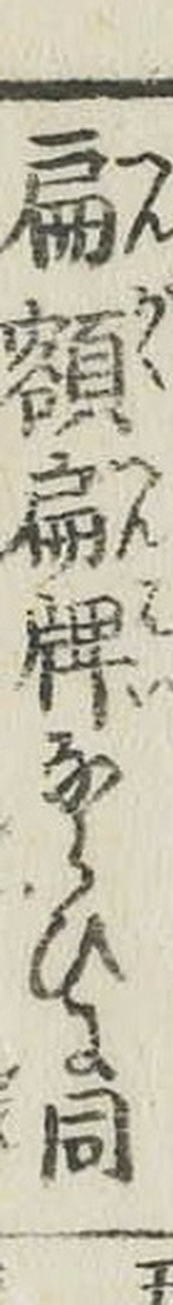扁額扁牌ならひに同
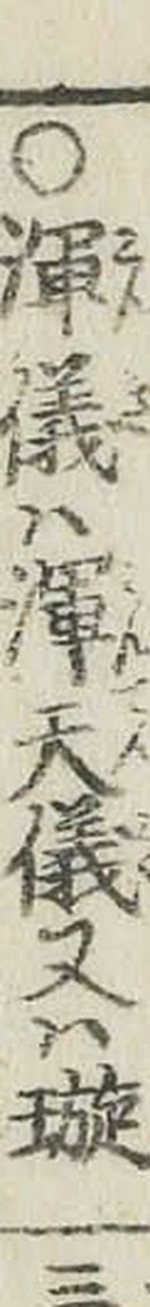○渾儀は渾天儀又は璇
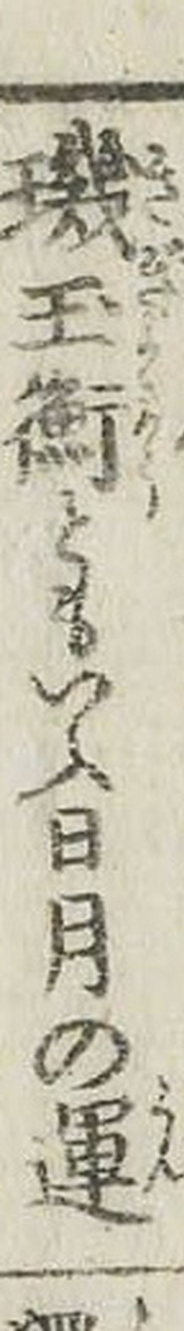璣玉衡ともいふ日月の運
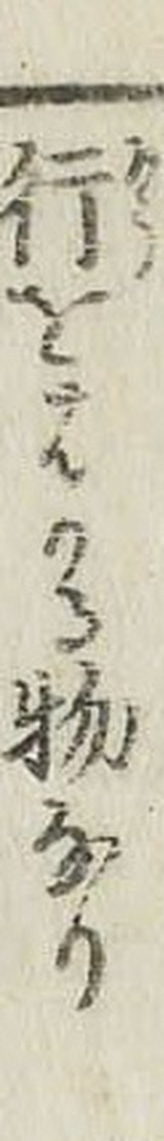行をはかる物なり
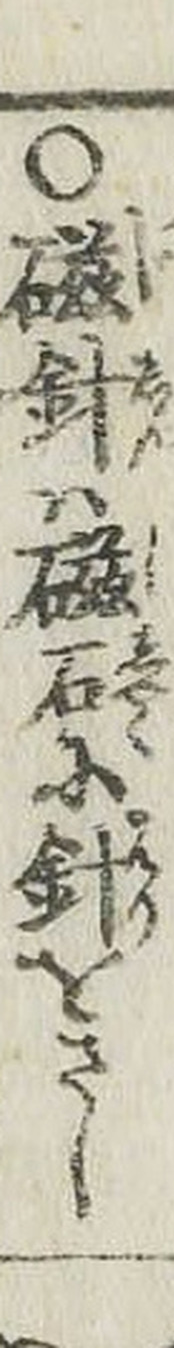○磁針は磁石に針をさし
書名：増補頭書訓蒙図彙大成 10巻 5:巻之9-11
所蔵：東京学芸大学教育コンテンツアーカイブ
